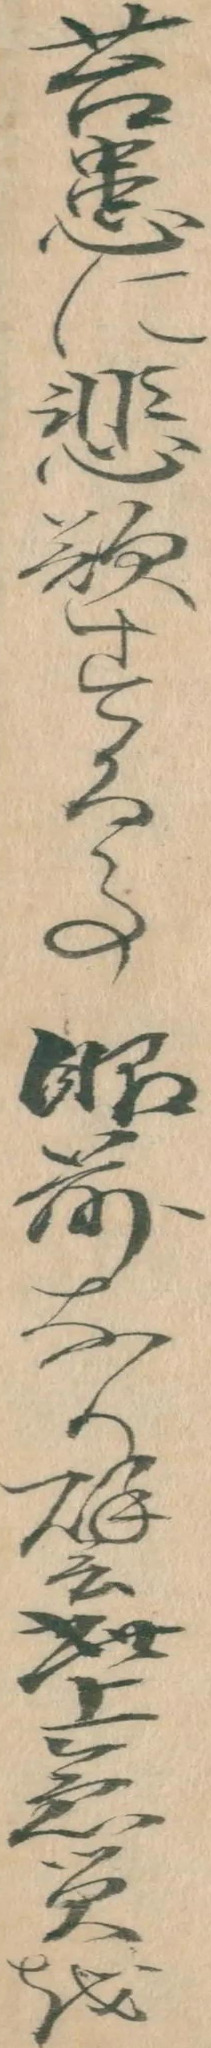苦患に悲歎する事眼前なり譬此上急災を

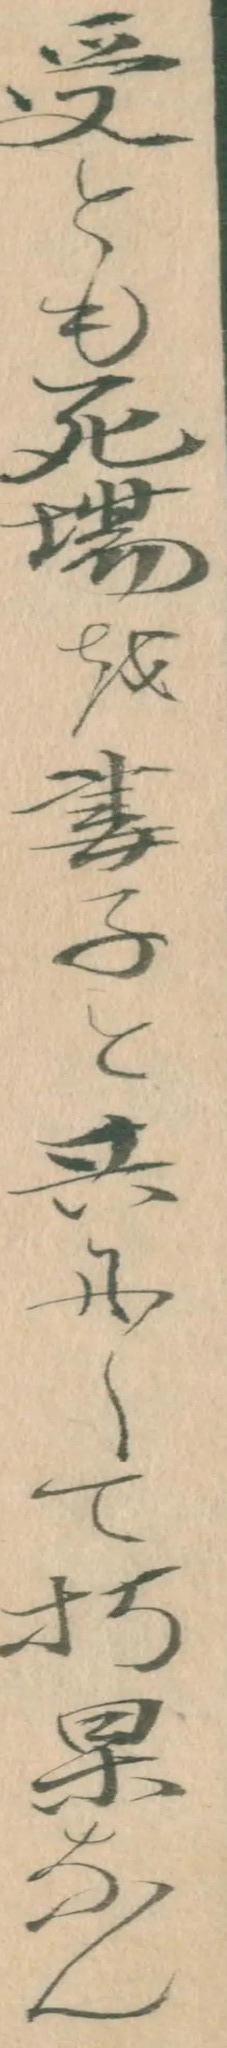受とも死場を妻子と共にして朽果なん
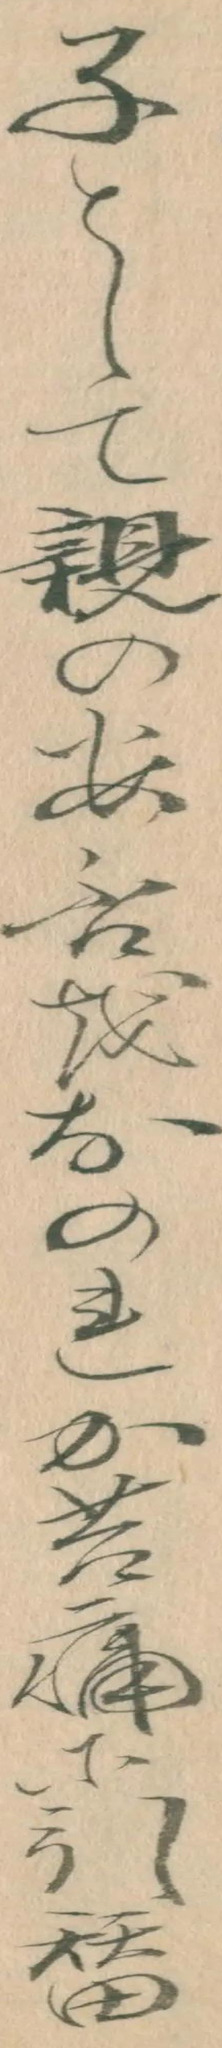子として親の安否をおのれか苦痛に引替
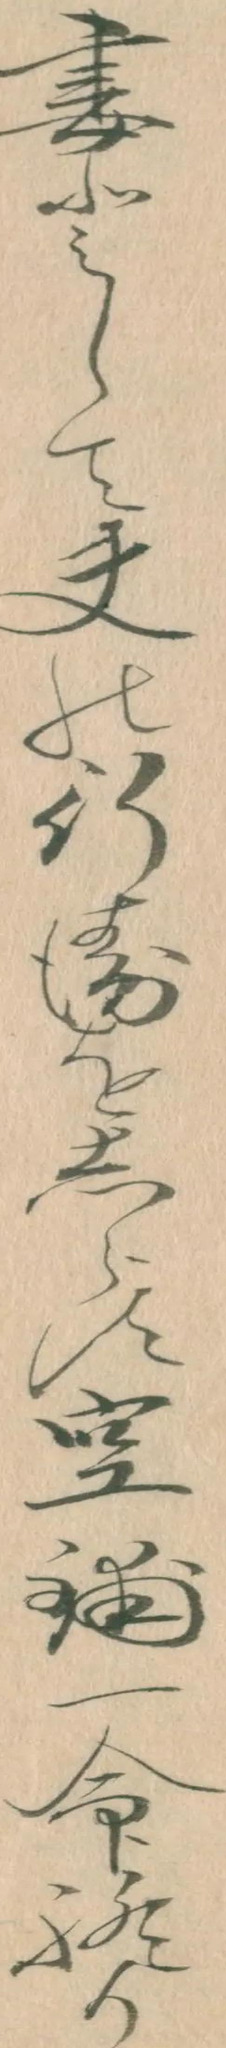妻として夫の行衛をしらす空鋪一命終り
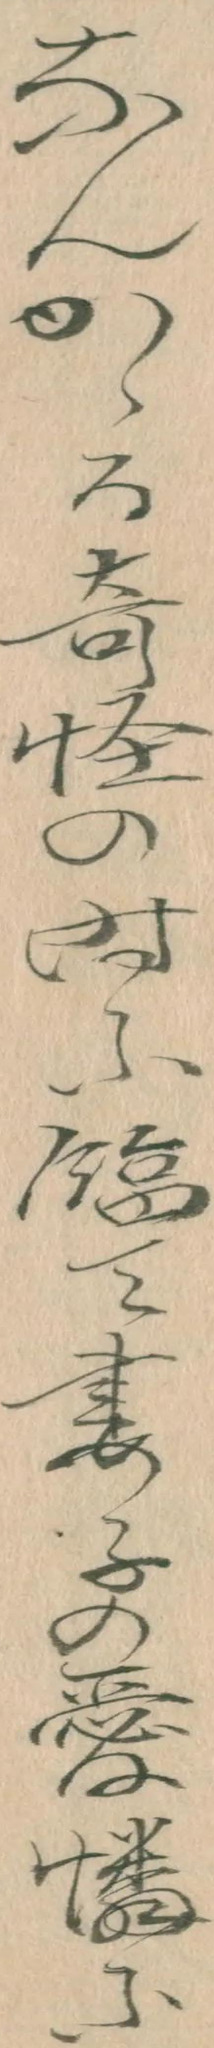なんかゝる奇怪の時に臨て妻子の愛憐に
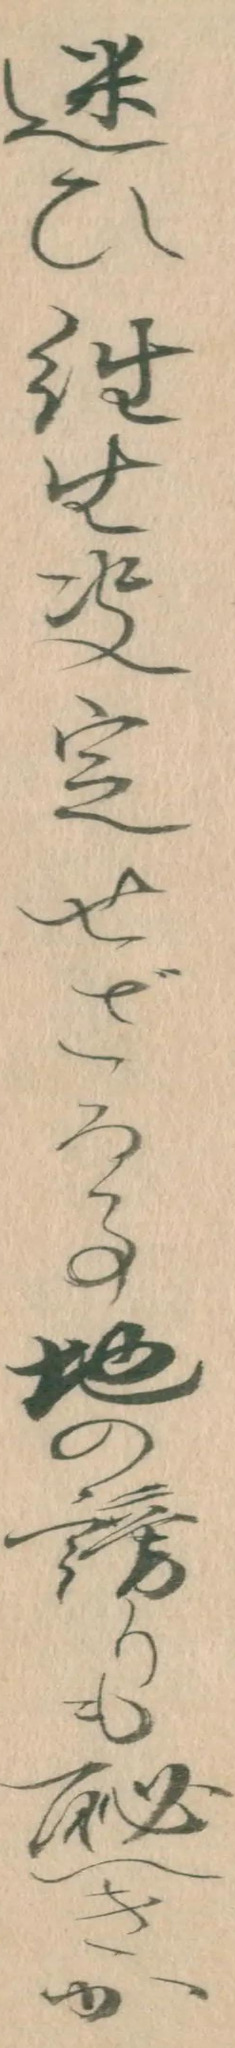迷ひ往生決定せざる事地の謗りも恥へきか
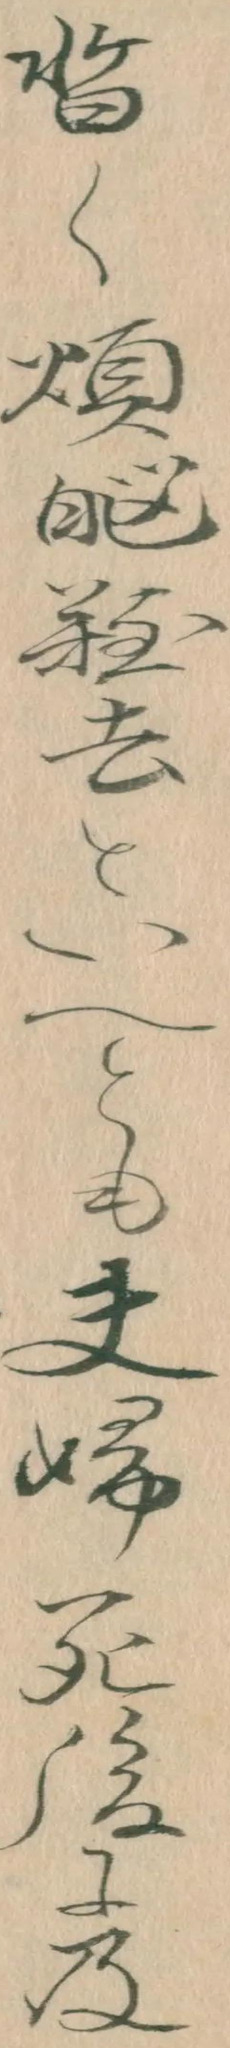暫く煩脳難去といへとも夫婦死後に及
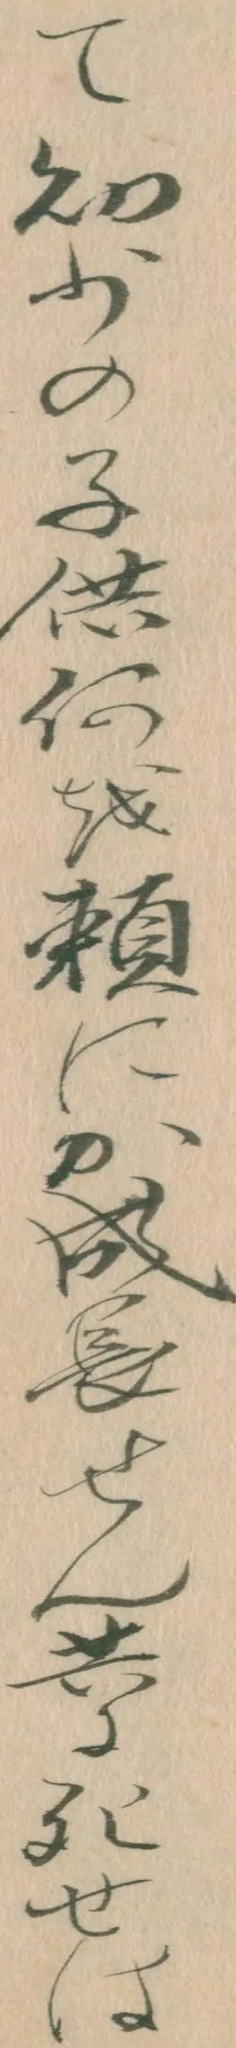て幼少の子供何を頼にか成長せん共に死せは
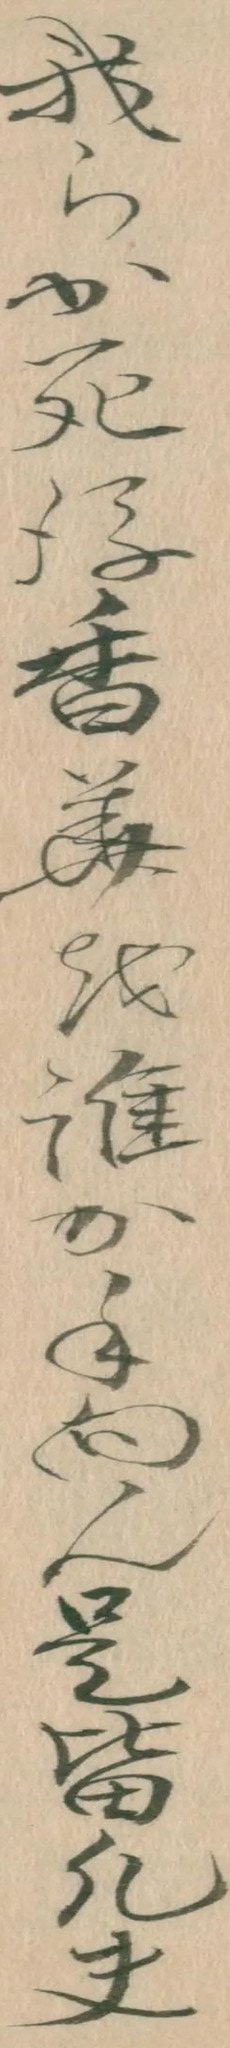我らか死後香華を誰か手向ん是皆凡夫
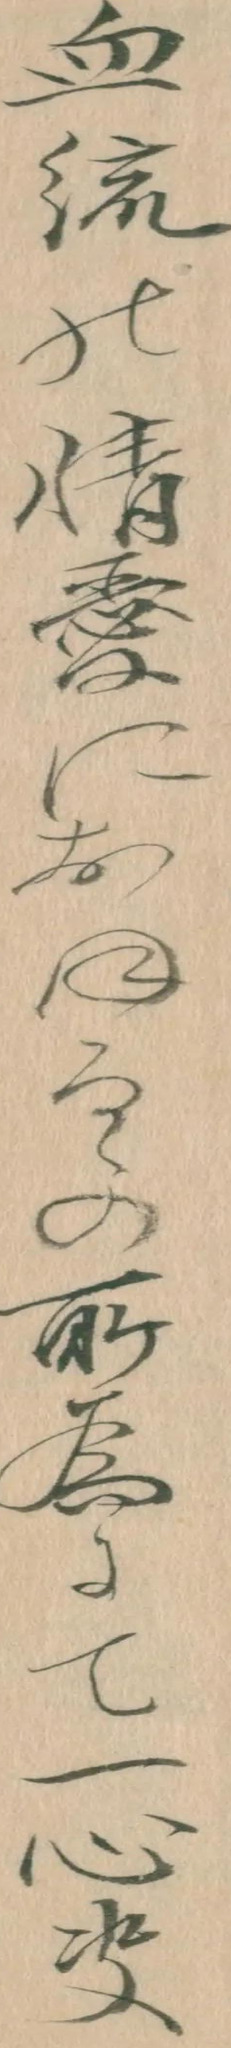血統の情愛におほるゝの所為にて一心決
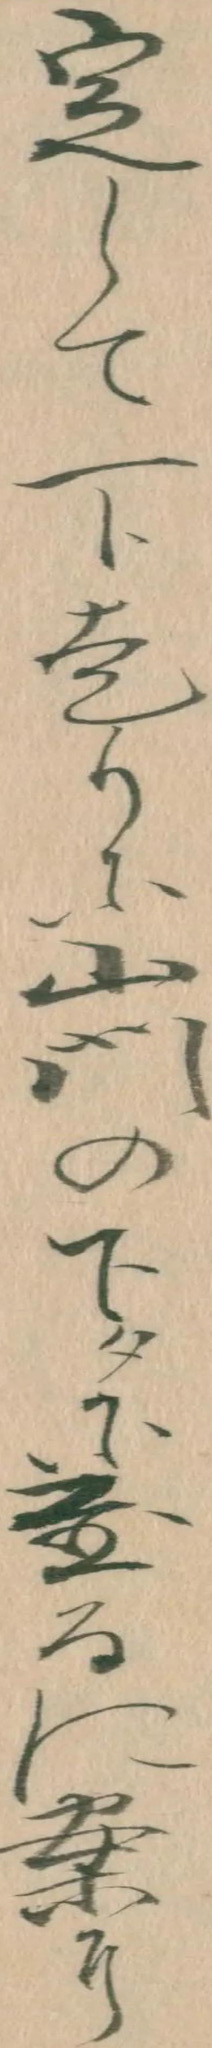定して一ト走りに山門の下タに至るに案に
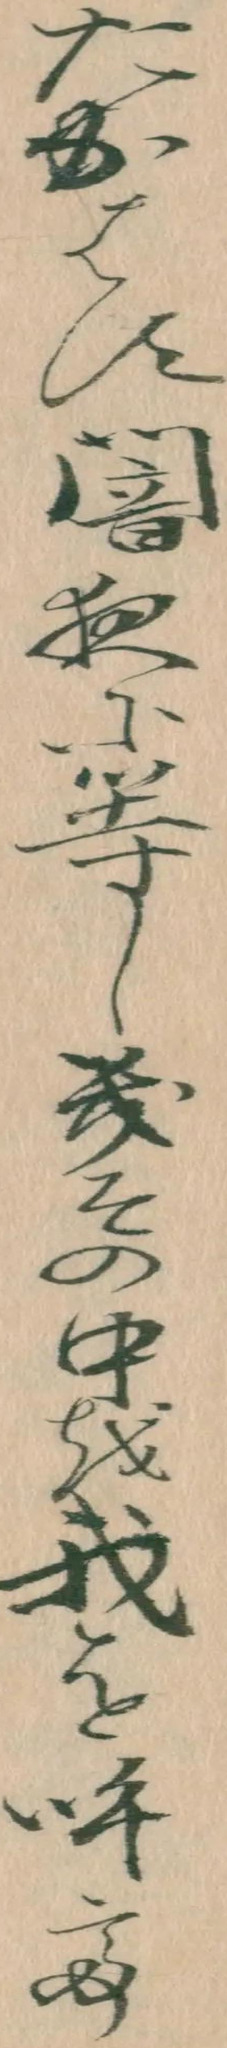たかはす闇夜に等しきその中を我を呼て
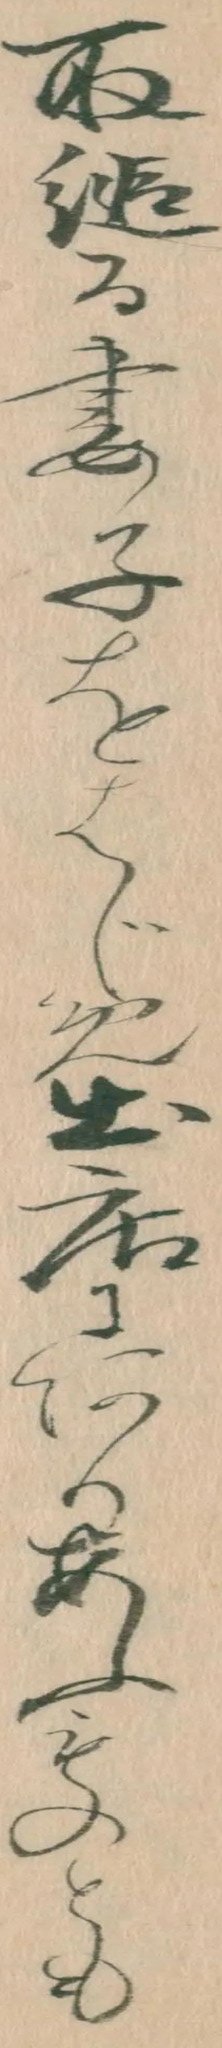取縋る妻子をはじめ出店にありあふものとも
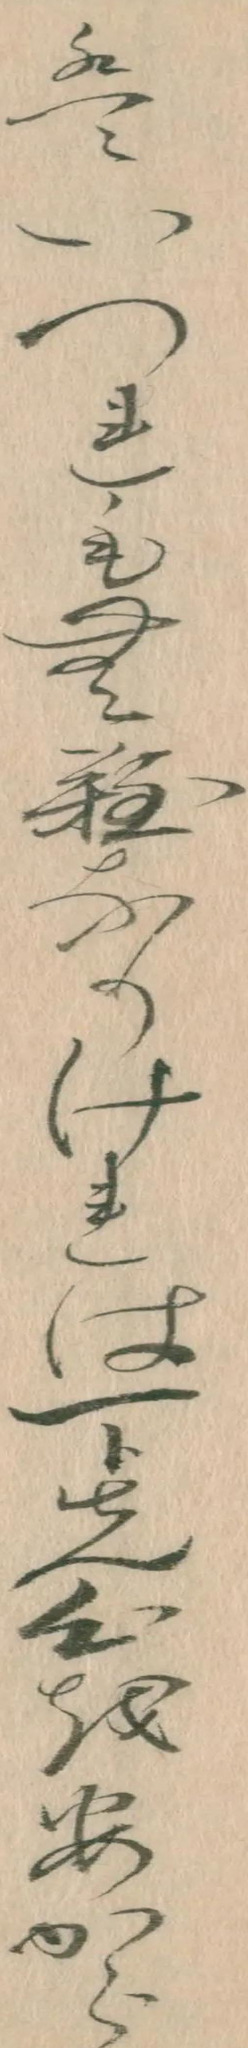はいつれも無難なりけれは一ト先心を安から
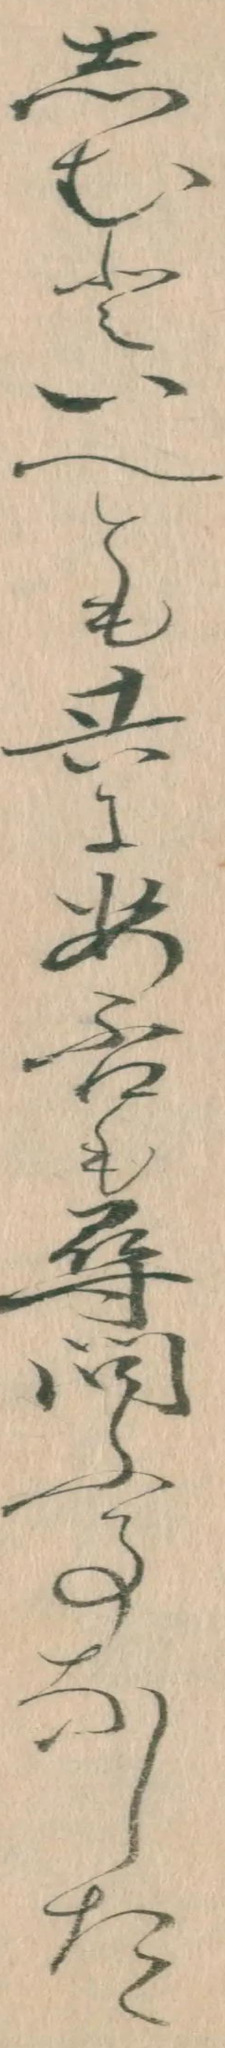しむといへとも共に安否も尋問ふ事なくたゝ
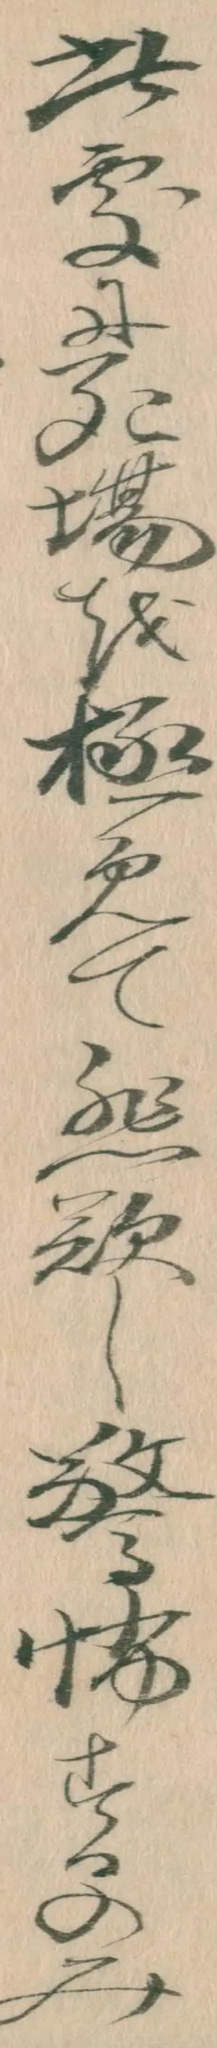此処に死場を極めて悲歎し驚怖するのみ
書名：俗語之種. [3]
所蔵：国立国会図書館 National Diet Library, JAPAN
